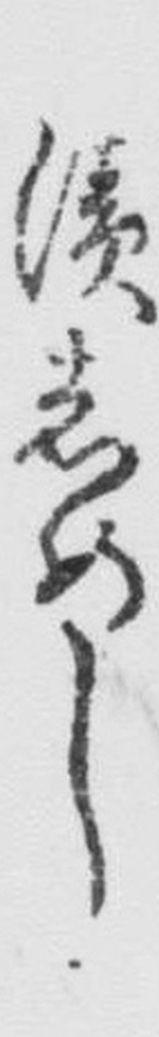漬しめし
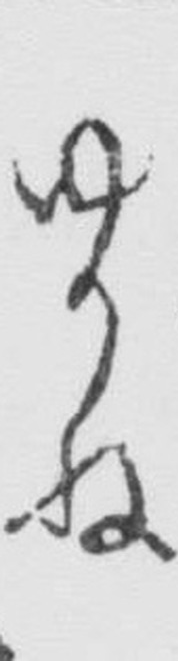ゆりね
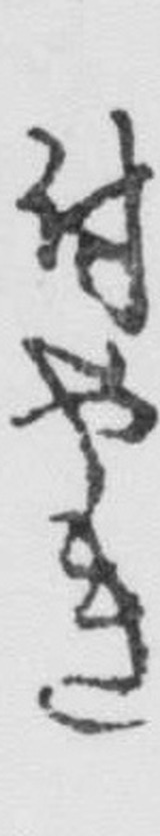付やき
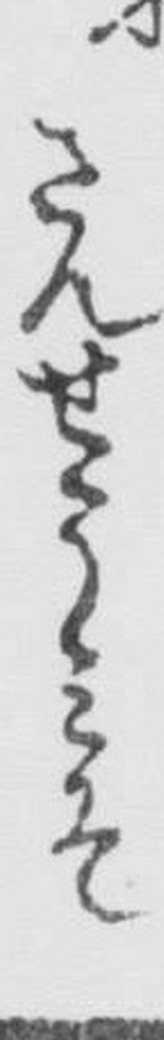さんせうみそ
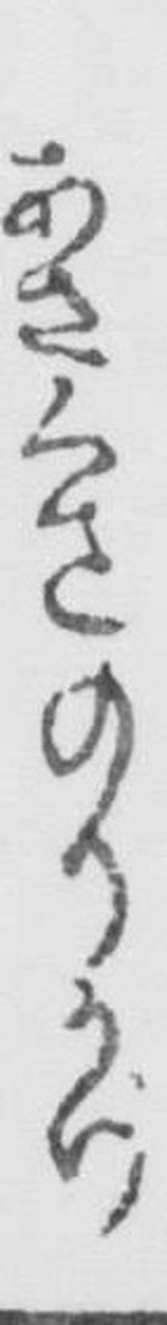あさくさのりかけ
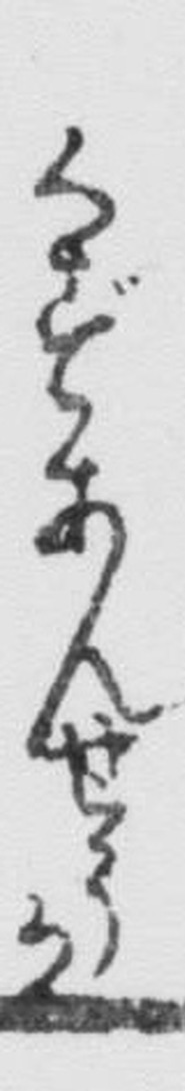くずあんせうか
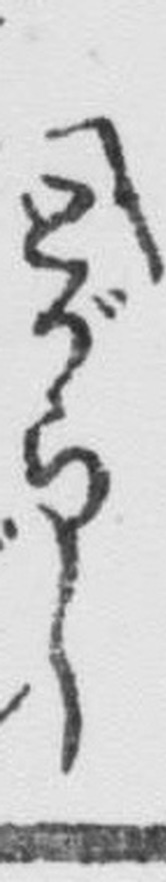〽とがらし
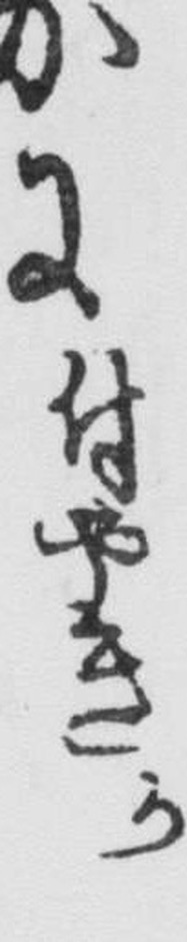かに付やきか
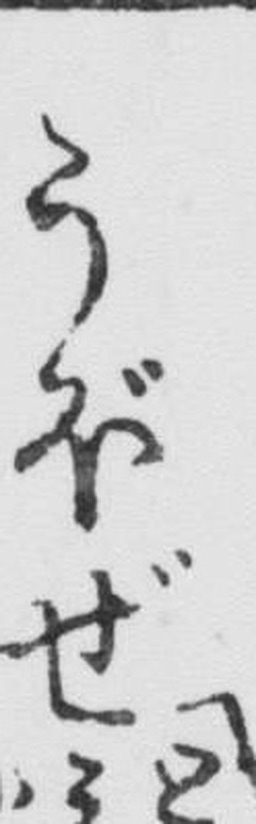うぼぜ
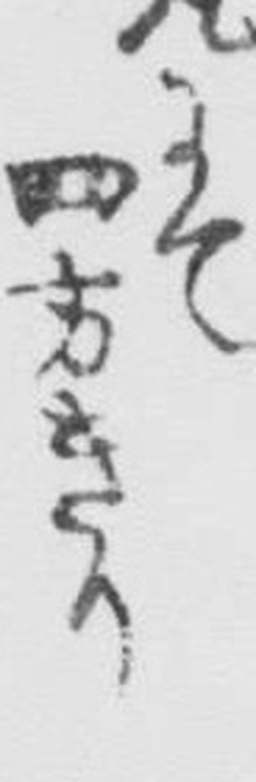四方きり
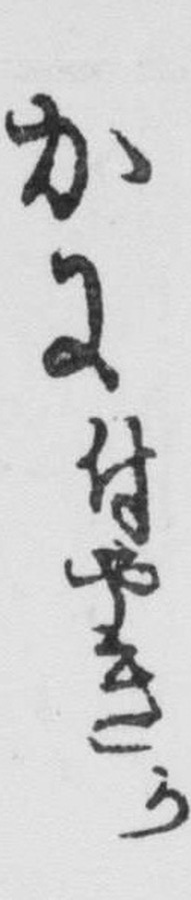かに付やきか
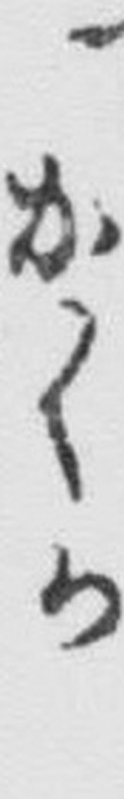かくか
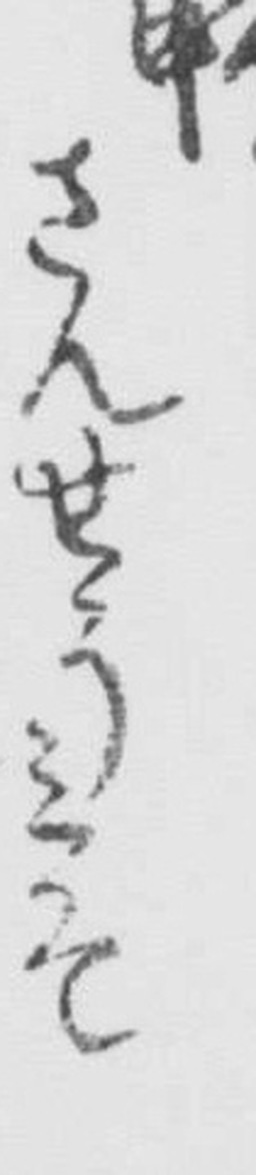さんせうみそ
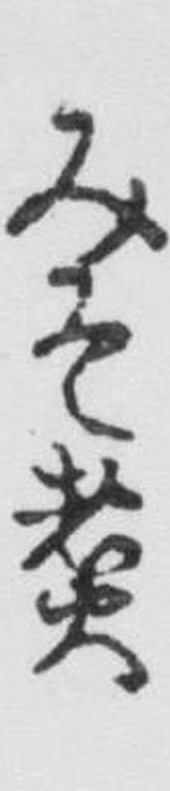みそ煮
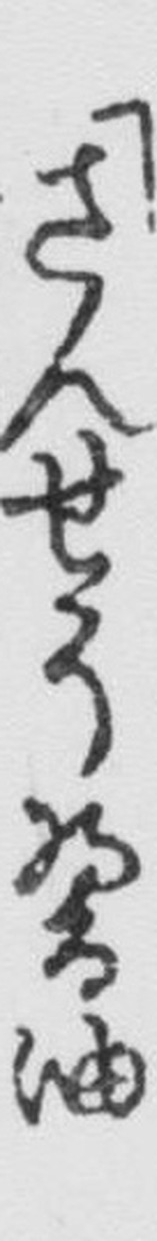〽さんせう醤油
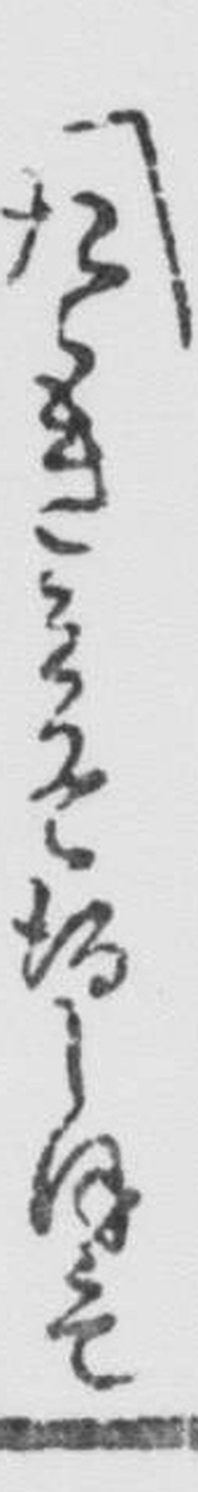〽たゝきみそ酒しほにて
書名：諸家通用/即席料理
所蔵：大阪府立大学学術情報センター 国文学研究資料館
